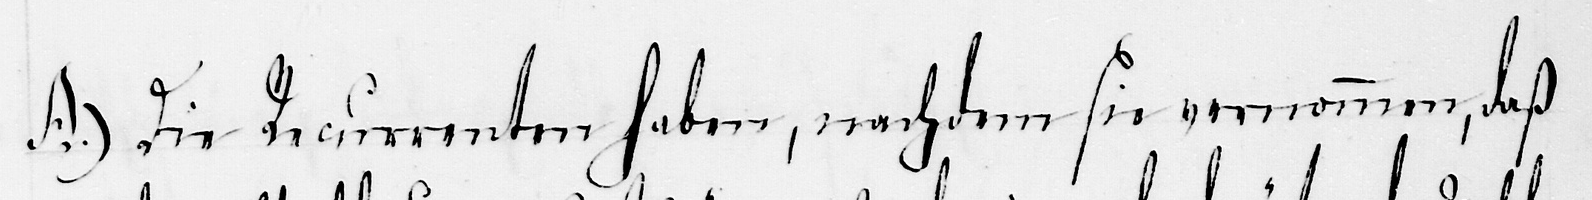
A.) Die Recurrenten haben, nachdem sie vernommen, daß
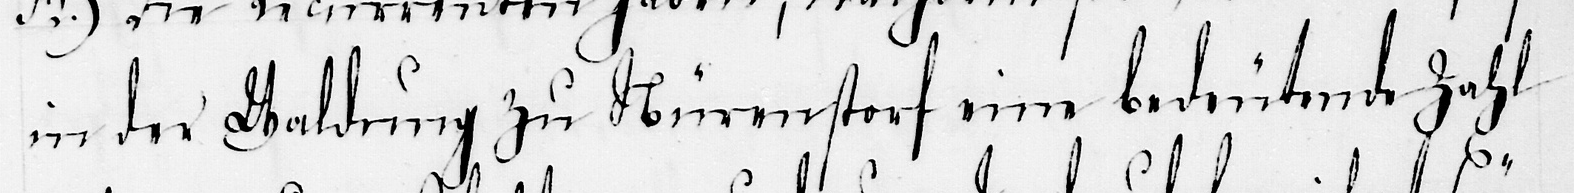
in der Waldung zu Nürenstorf eine bedeutende Zahl
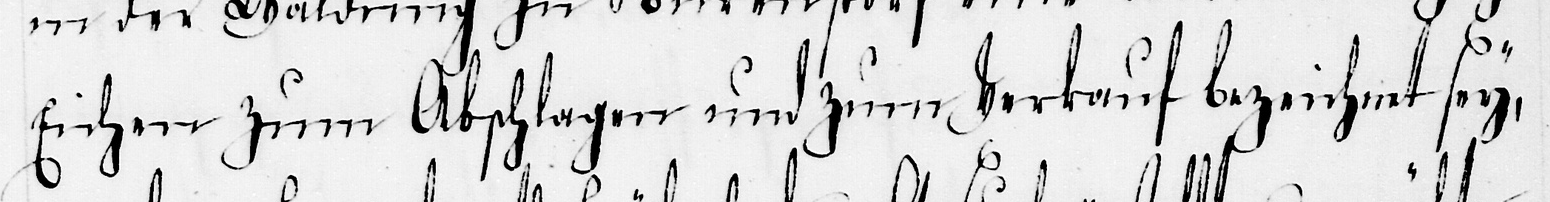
Eichen zum Abschlagen und zum Verkauf bezeichnet sey,
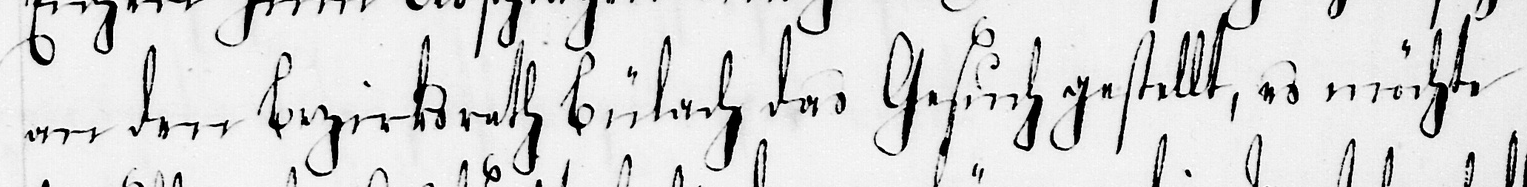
an den Bezirksrath Bülach das Gesuch gestellt, es möchte
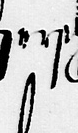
ft
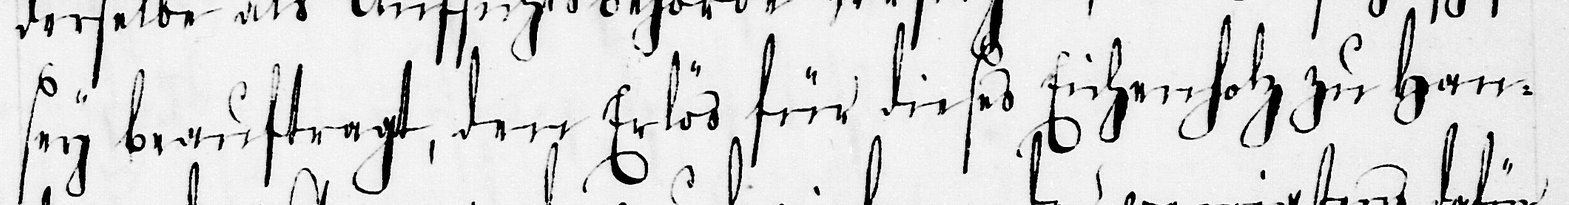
sey beauftragt, den Erlös für dieses Eichenholz zu Han¬
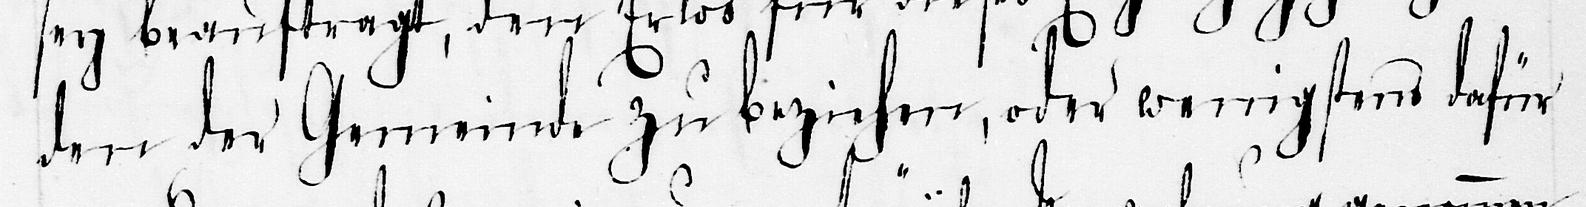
den der Gemeinde zu beziehen, oder wenigstens dafür
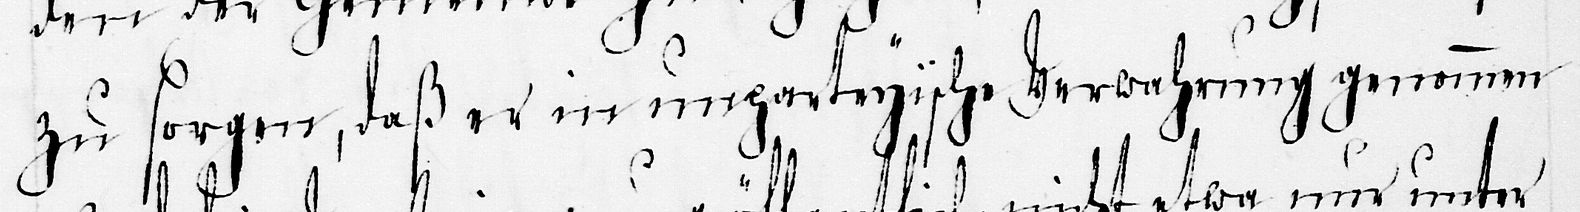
zu sorgen, daß er in unparteyische Verwahrung genommen
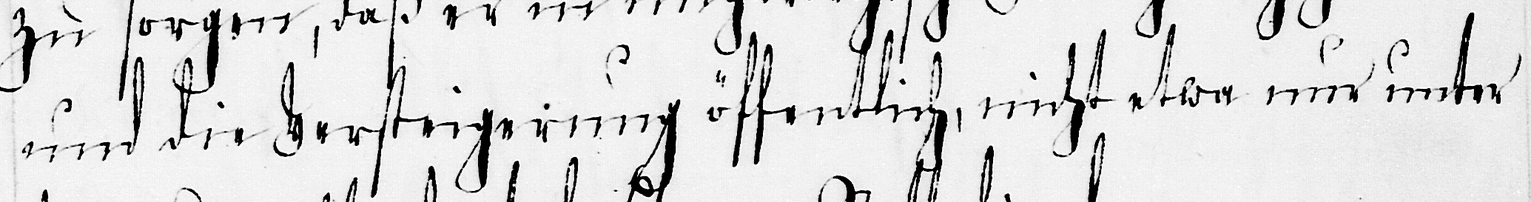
und die Versteigerung öffentlich, nicht etwa nur unter
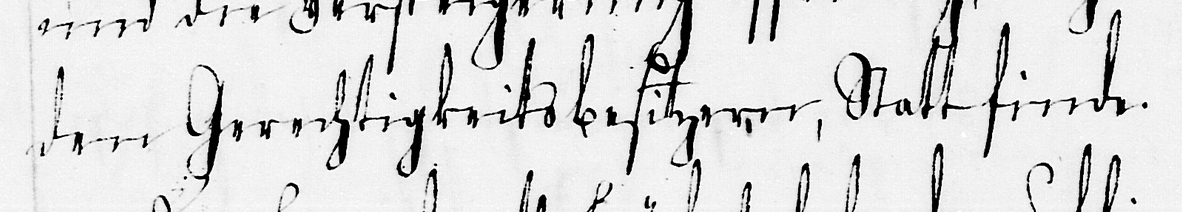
den Gerechtigkeitsbesitzern, Statt finde.
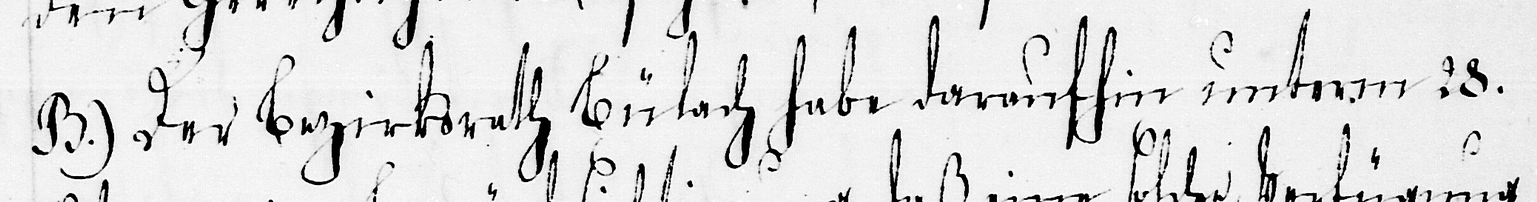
B.) Der Bezirksrath Bülach habe daraufhin unterm 28.
